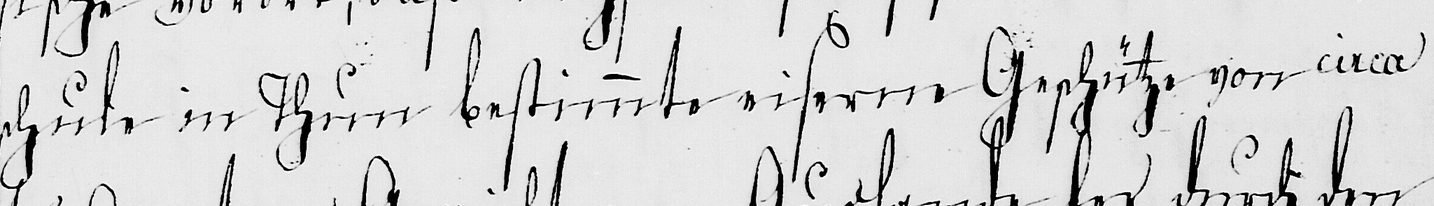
chule in Thun bestimmte eiserne Geschütze von circa
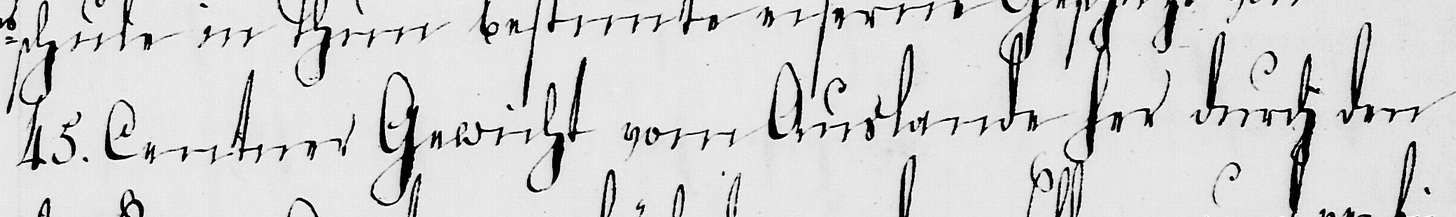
45. Centner Gewicht vom Auslande her durch den
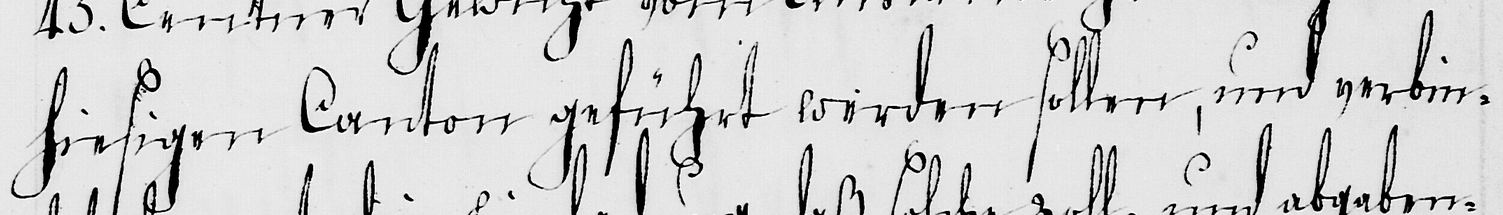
hiesigen Canton geführt werden sollen, und verbin¬
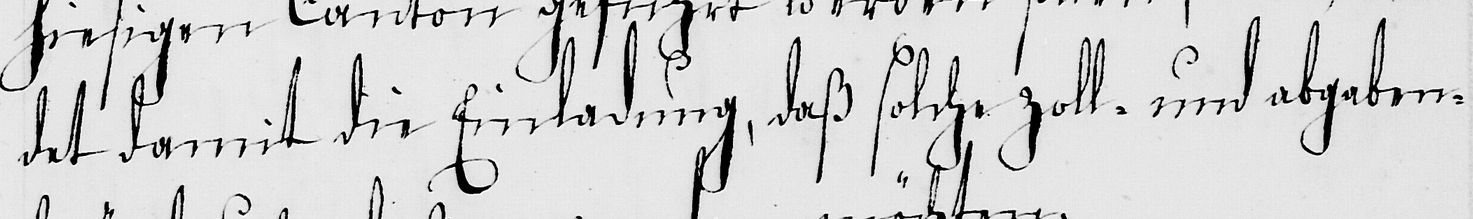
det damit die Einladung, daß solche zoll- und abgabe¬
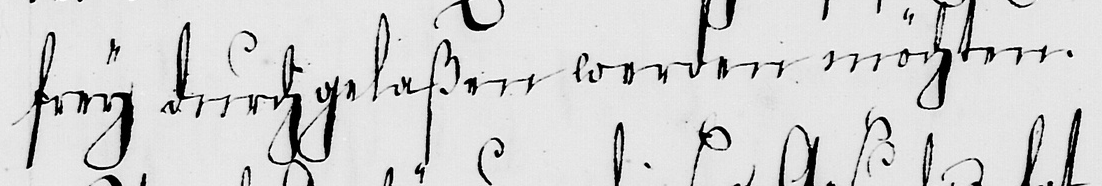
nfrey durchgelaßen werden möchten.
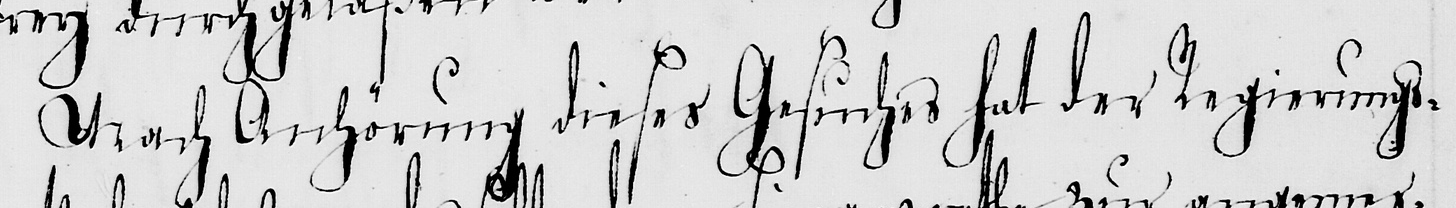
Nach Anhörung dieses Gesuches hat der Regierungs¬
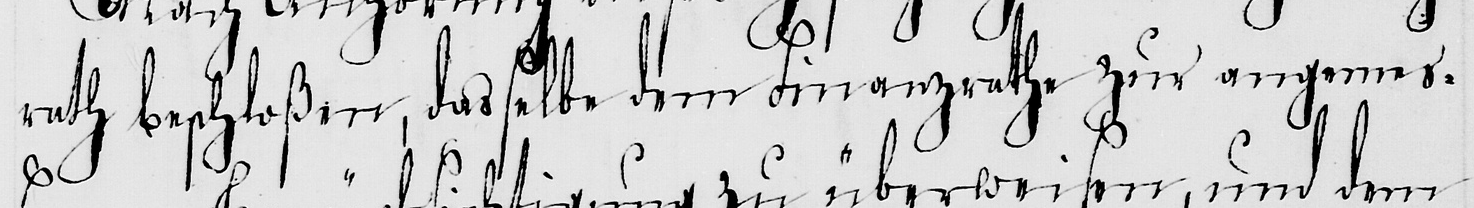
rath beschloßen, dasselbe dem Finanzrathe zur angemeß¬
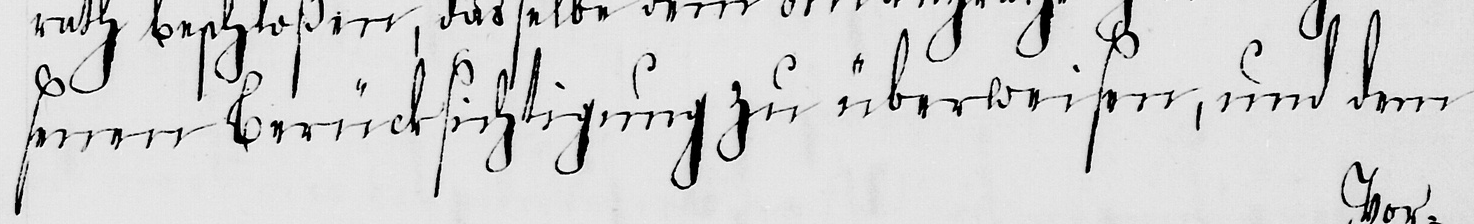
enen Berücksichtigung zu überweisen, und dem
